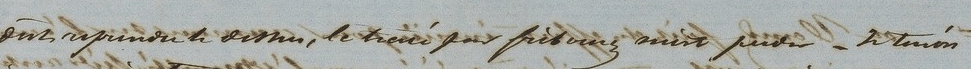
dût reprendre le dessus, le tracé par Fribourg serait perdu – Je tenais
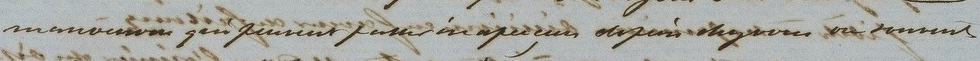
manœuvres qui peuvent passer inaperçues de près chez vous ou souvent
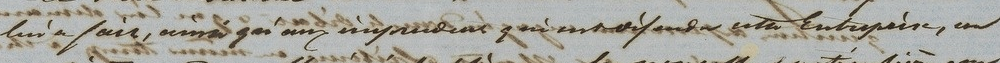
lui a fait, aussi qu'aux imprudents qui ont défendu cette Entreprise, un
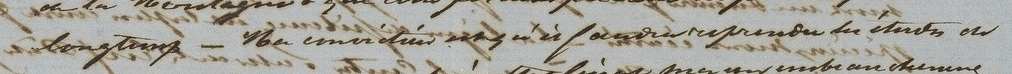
longtemps – Ma conviction est qu'il faudra reprendre les études de
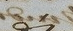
opinions sont
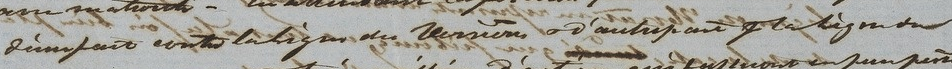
d'une part contre la Ligne des Verrières & d'autre part pour la Ligne
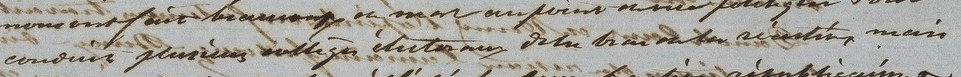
conduit plusieurs collèges électoraux ds les bras de la réaction, mais
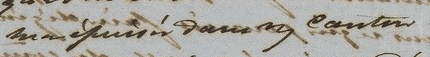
sera épuisée dans notre Canton –
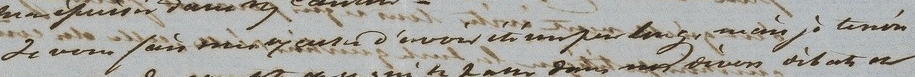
Je vous fais mes excuses d'avoir été un peu long, mais je tenais
